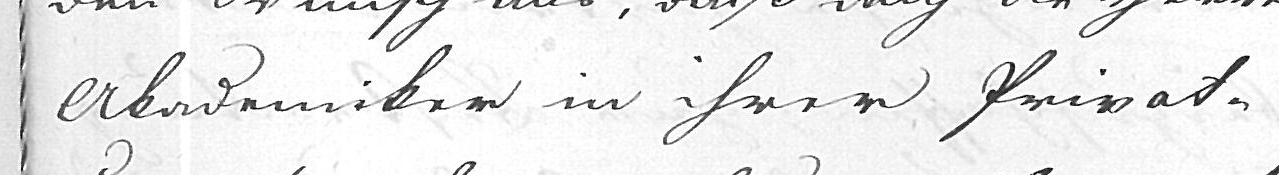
Akademiker in ihrer Privat-
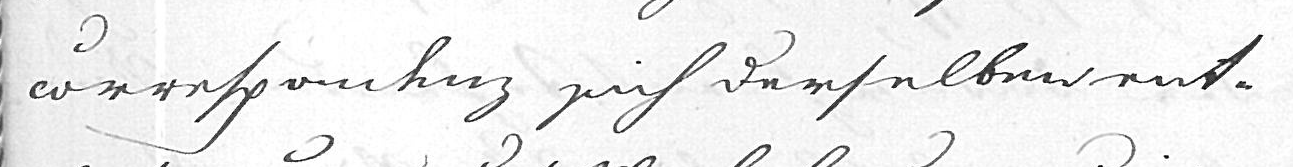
correspondenz sich derselbe ent-
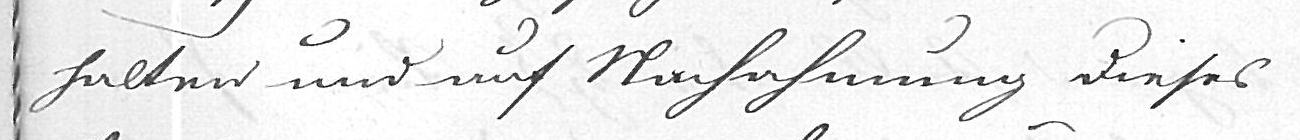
halten und auf Nachahmung dieses
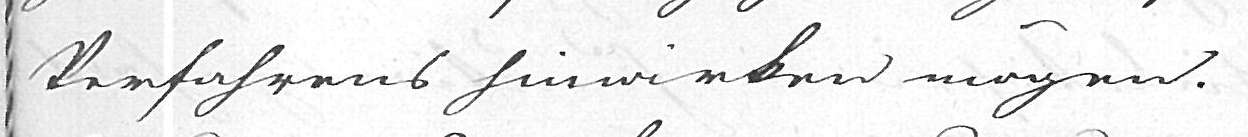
Verfahren hinwirken mögen.
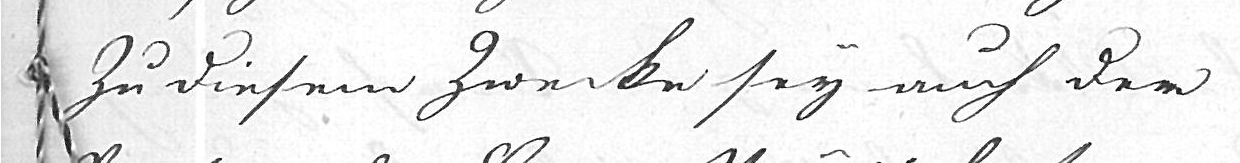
In diesen Zwecke sey auch der
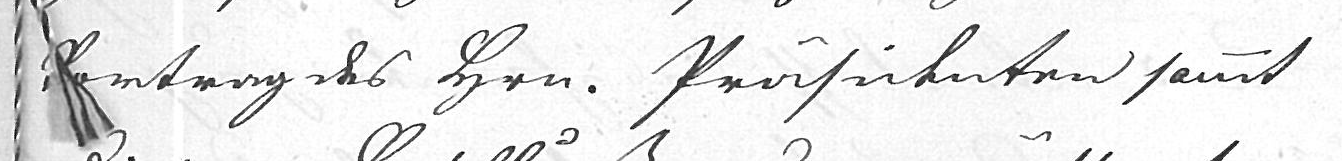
Vortrag des Hrn. Präsidenten sammt
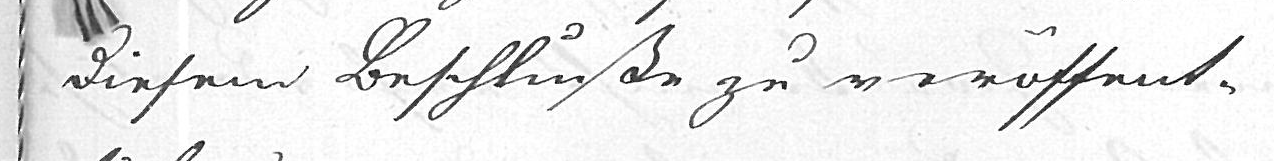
diesem Beschluße zu veröffent-
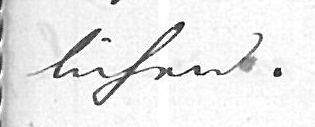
lichen.
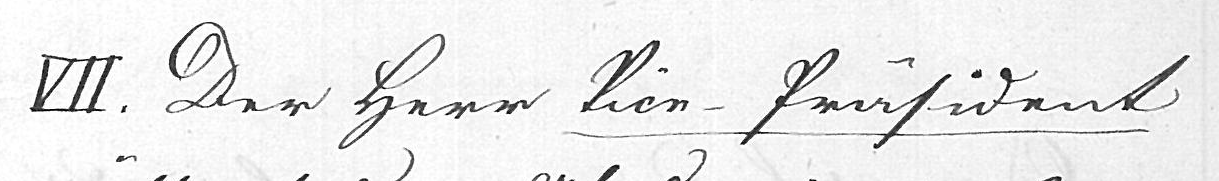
VII. Der Herr Vice-Präsident
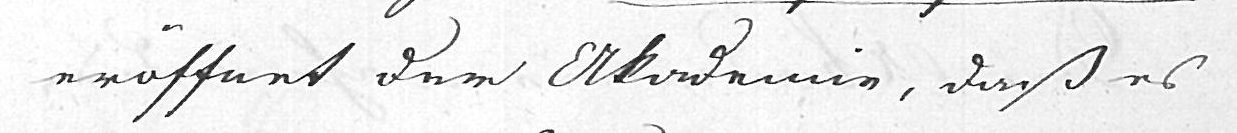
veröffnet der Akademie, daß es
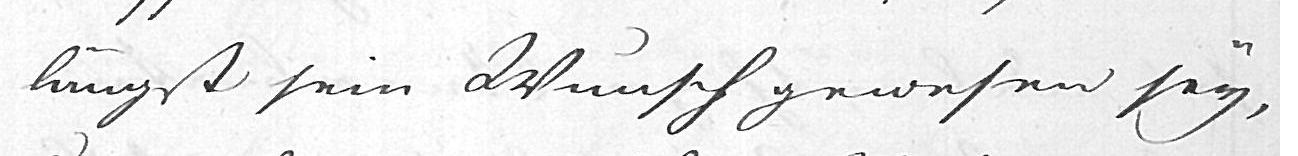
längst sein Wunsch gewesen sey,-
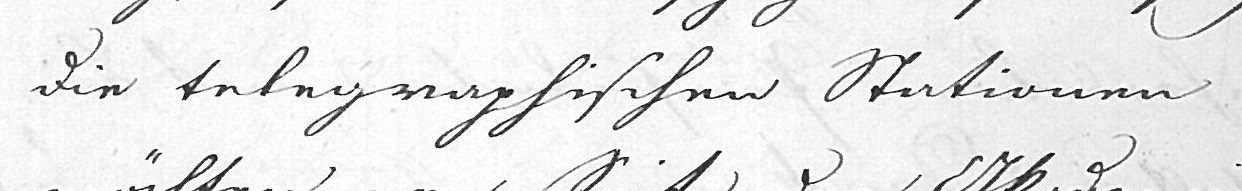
die telegraphischen Stationen
